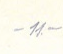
-11.-
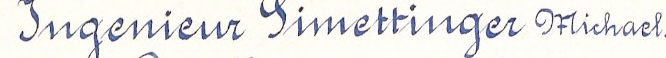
Ingenieur Simettinger Michael.
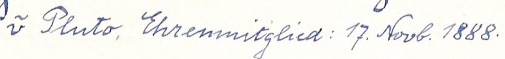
v/o Pluto, Ehrenmitglied: 17. Novb. 1888.
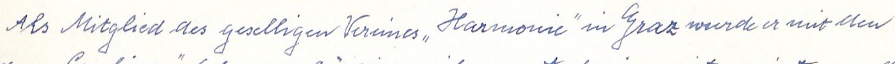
Als Mitglied des geselligen Vereines "Harmonie" in Graz wurde er mit den
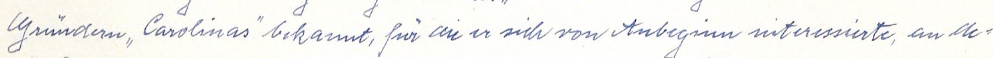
Gründern "Carolinas" bekannt, für die er sich von Anbeginn interessierte, an de-
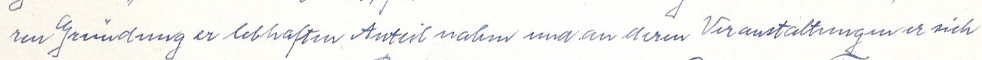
ren Gründung er lebhaften Anteil nahm und an deren Veranstaltungen er sich
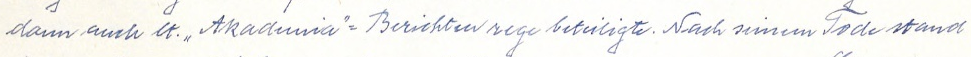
dann auch lt. "Akademia"-Berichten rege beteiligte. Nach seinem Tode stand
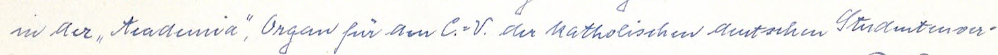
in der "Academia", Organ für am C.-V. der katholischen deutschen Studentenver-
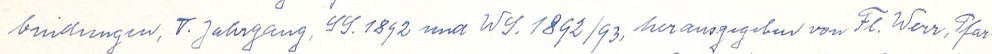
bindungen, V. Jahrgang, SS. 1892 und WS. 1892/93, herausgegeben von Fl. Werr, Pfar-
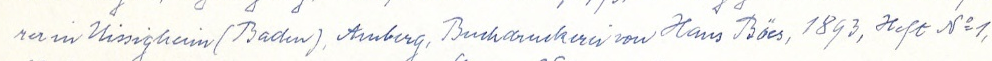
rer in Uissigheim (Baden), Amberg, Buchdruckerei von Hans Böes, 1893, Heft Nr. 1,
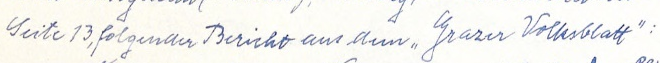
Seite 13, folgender Bericht aus dem "Grazer Volksblatt":
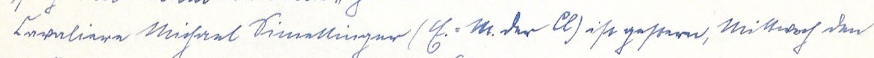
XXX Michael Simettinger (E.-M. der Cl) ist gestern, Mittwoch den
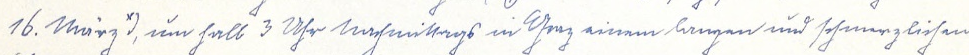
16. Märzx), um halb 3 Uhr Nachmittags in Graz einem langen und schmerzlichen
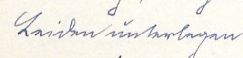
Leiden unterlegen.
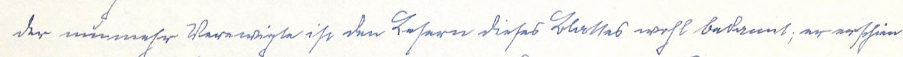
Der nunmehr Verweigte ist den Lesern dieses Blattes wohl bekannt; er erschien
